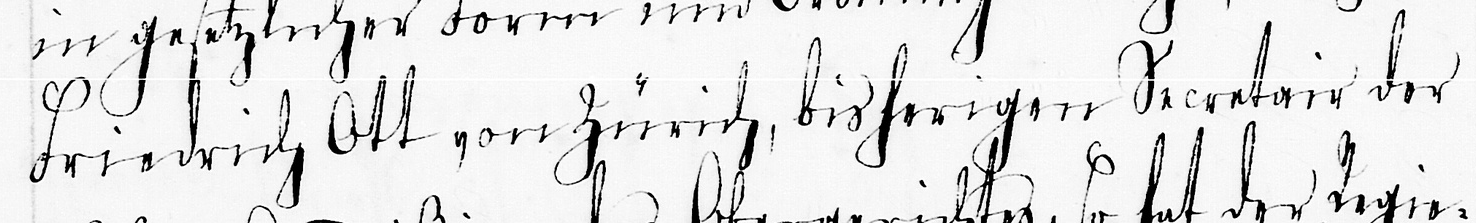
Friedrich Ott von Zürich, bisherigen Secretair der
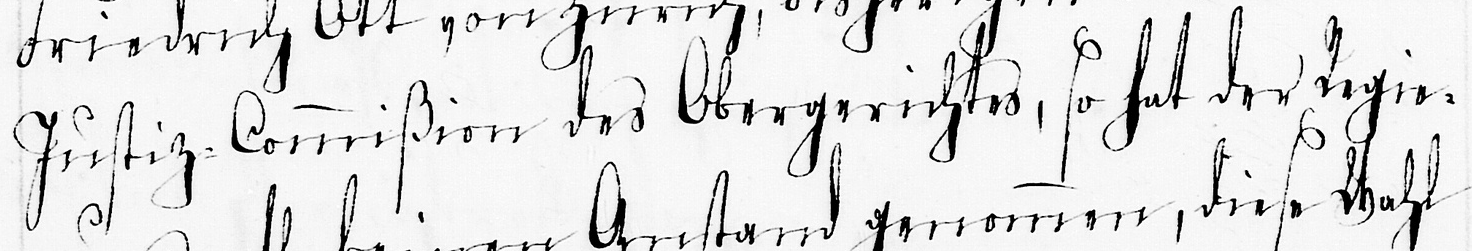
Justiz-Commißion des Obergerichtes, so hat der Regie¬
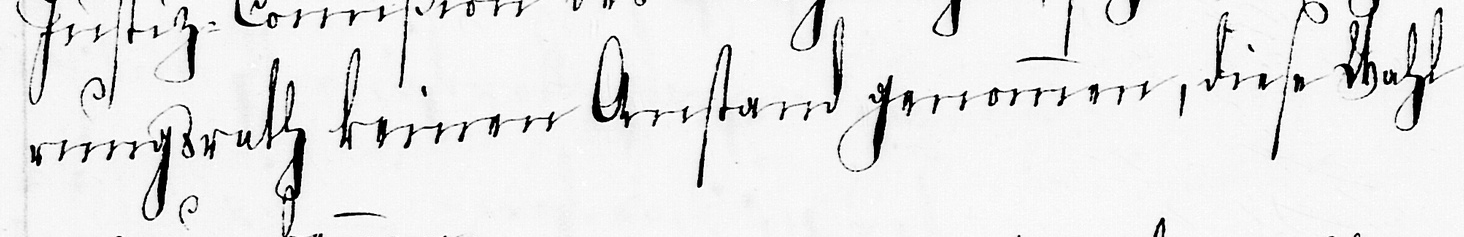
rungsrath keinen Anstand genommen, diese Wahl
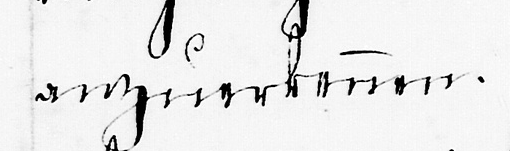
anzuerkennen.
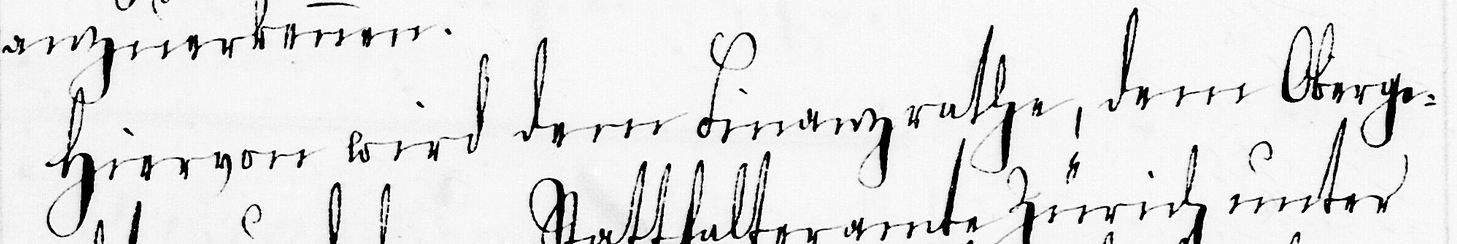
Hiervon wird dem Finanzrathe, dem Oberge¬
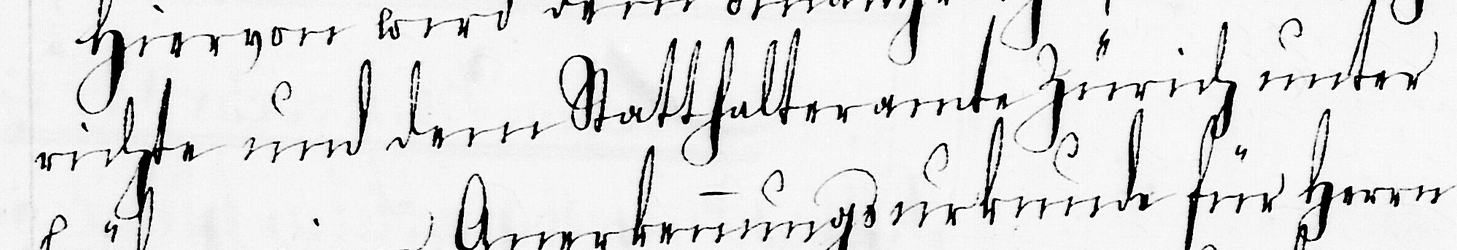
richte und dem Statthalteramte Zürich unter
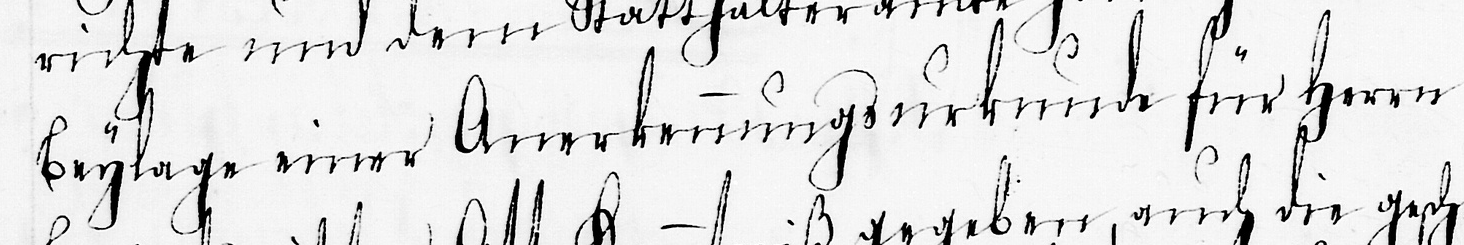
Beylage einer Anerkennungsurkunde für Herrn
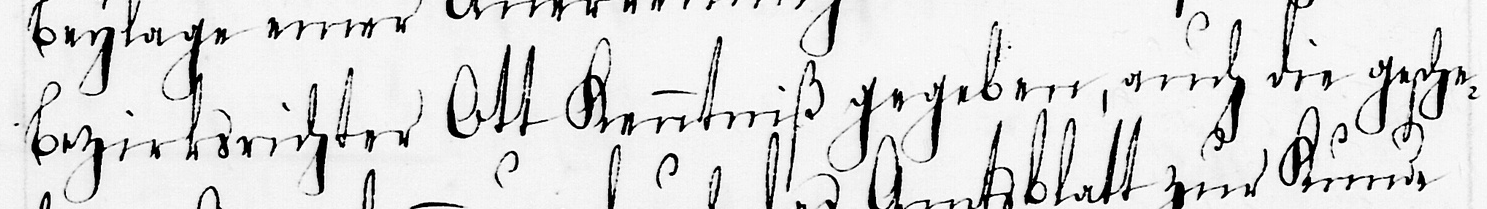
Bezirksrichter Ott Kenntniß gegeben, auch die gesch¬
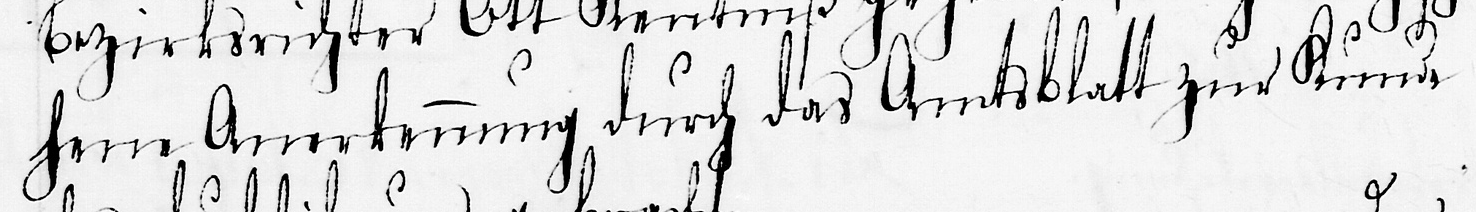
ehene Anerkennung durch das Amtsblatt zur Kunde
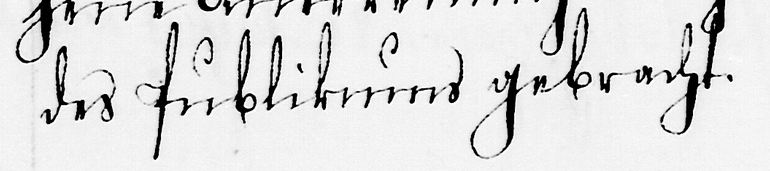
des Publikums gebracht.
